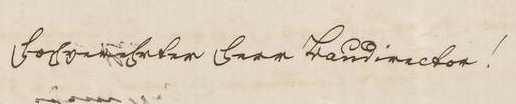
Hochverehrter Herr Baudirector!
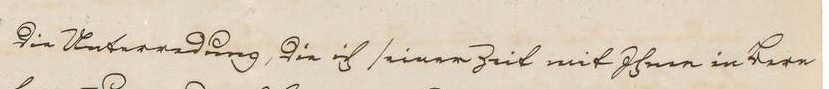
Die Unterredung, die ich seiner Zeit mit Ihnen in Bern
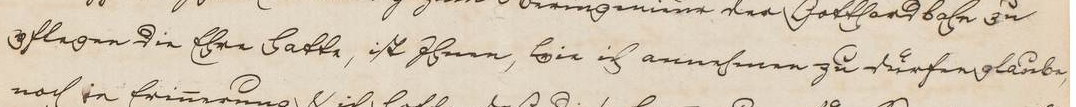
pflegen die Ehre hatte, ist Ihnen, wie ich annehmen zu dürfen glaube,
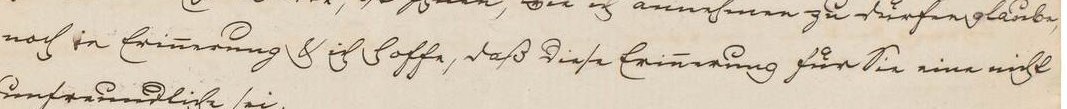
noch in Erinnerung & ich hoffe, daß diese Erinnerung für Sie eine nicht
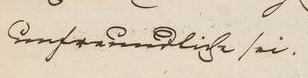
unfreundliche sei.
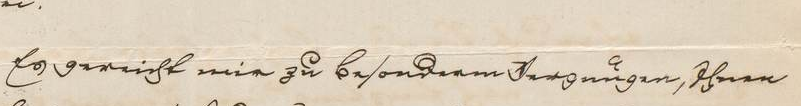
Es gereicht mir zu besonderm Vergnügen, Ihnen
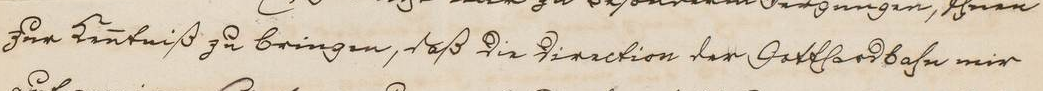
zur Kenntniß zu bringen, daß die Direction der Gotthardbahn mir
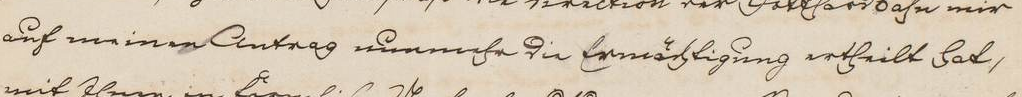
auf meinen Antrag nunmehr die Ermächtigung ertheilt hat,
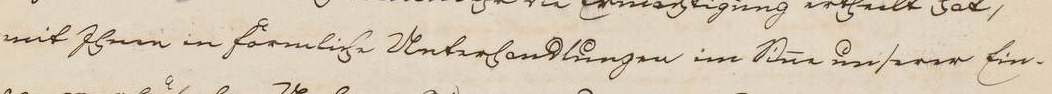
mit Ihnen in förmliche Unterhandlungen im Sinne unserer Ein-
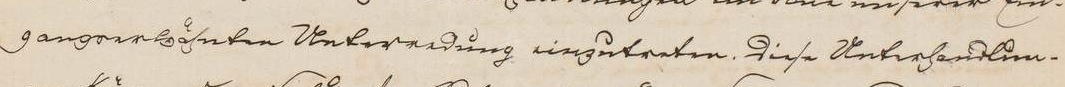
gangserwähnten Unterredung einzutreten. Diese Unterhandlun-
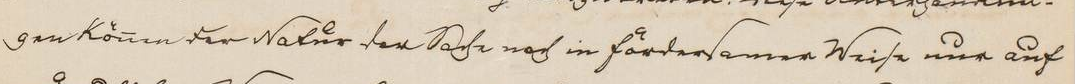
gen können der Natur der Sache nach in fördersamer Weise nur auf
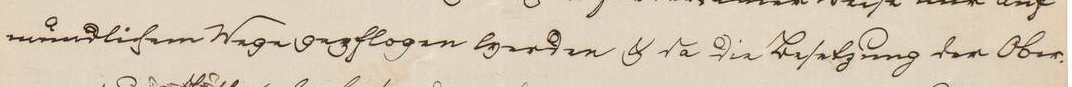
mündlichem Wege gepflogen werden & da die Besetzung der Ober-
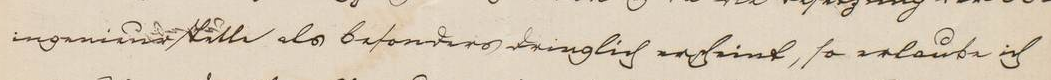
ingenieurstelle als besonders dringlich erscheint, so erlaube ich
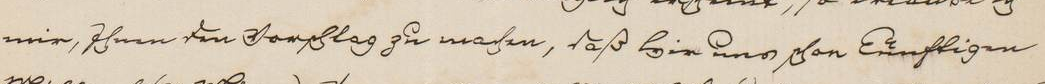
mir, Ihnen den Vorschlag zu machen, daß wir uns schon künftigen
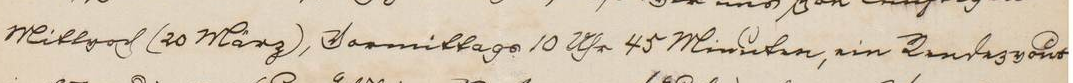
Mitwoch (20 März), Vormittags 10 Uhr 45 Minuten, ein Rendezvous
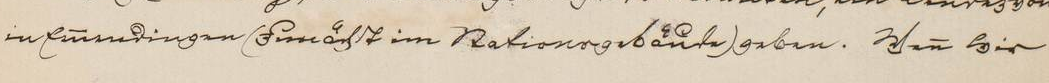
in Emmendingen (zunächst im Stationsgebäude) geben. Wenn wir
